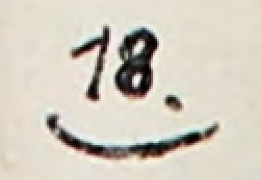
18.
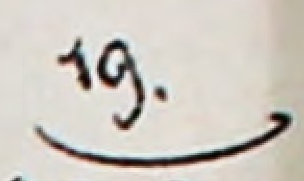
19.
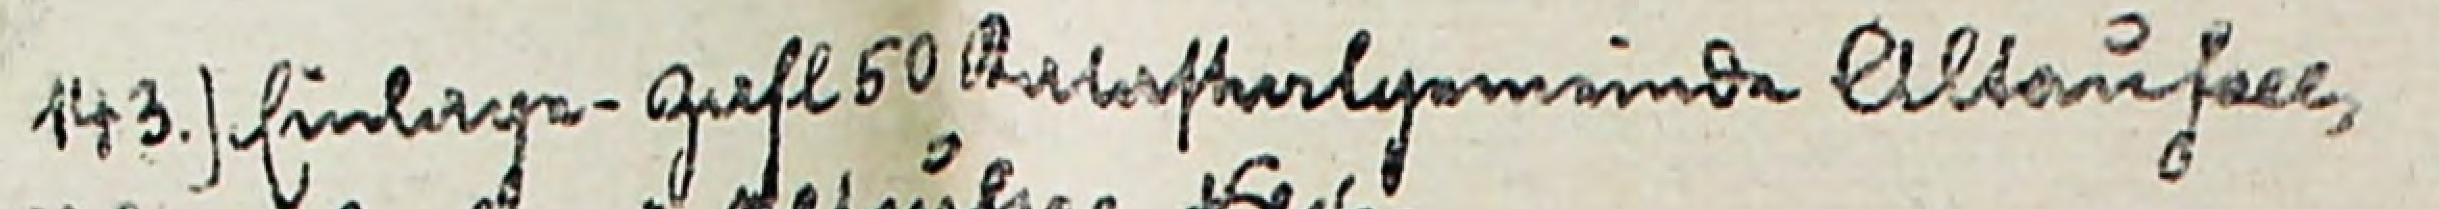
143.) Einlage - Zahl 50 Katastralgemeinde Abtaussee,
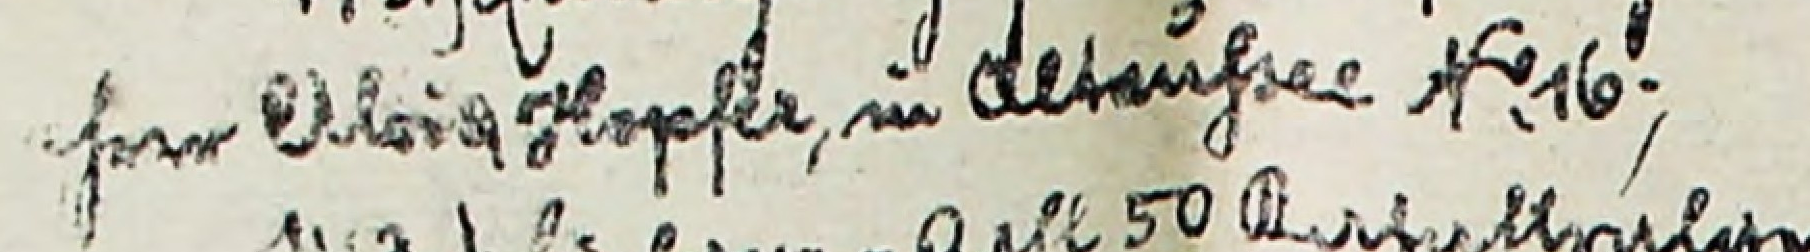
Herr Alois Hopfer, in Altaussee № 16;
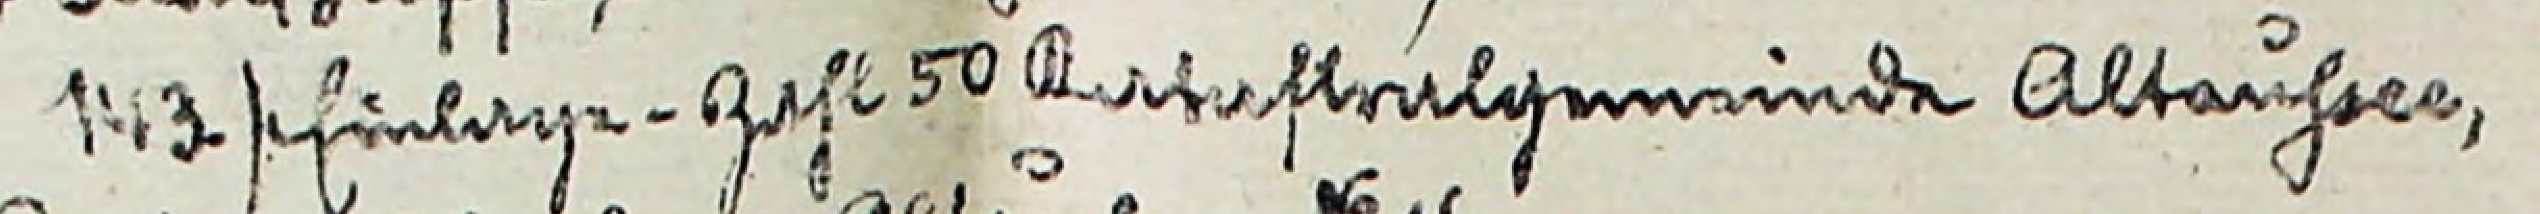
143.) Einlage - Zahl 50 Katastralgemeinde Altaussee,
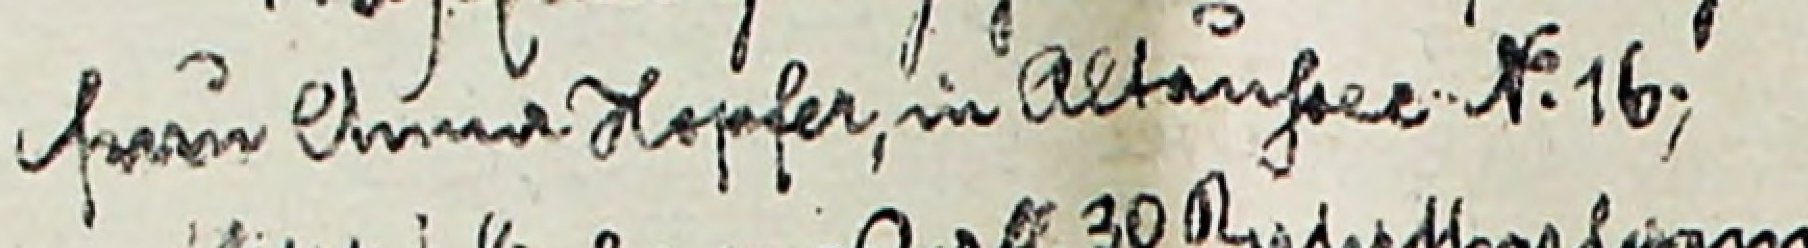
Frau Anna Hopfer, in Altaussee № 16;
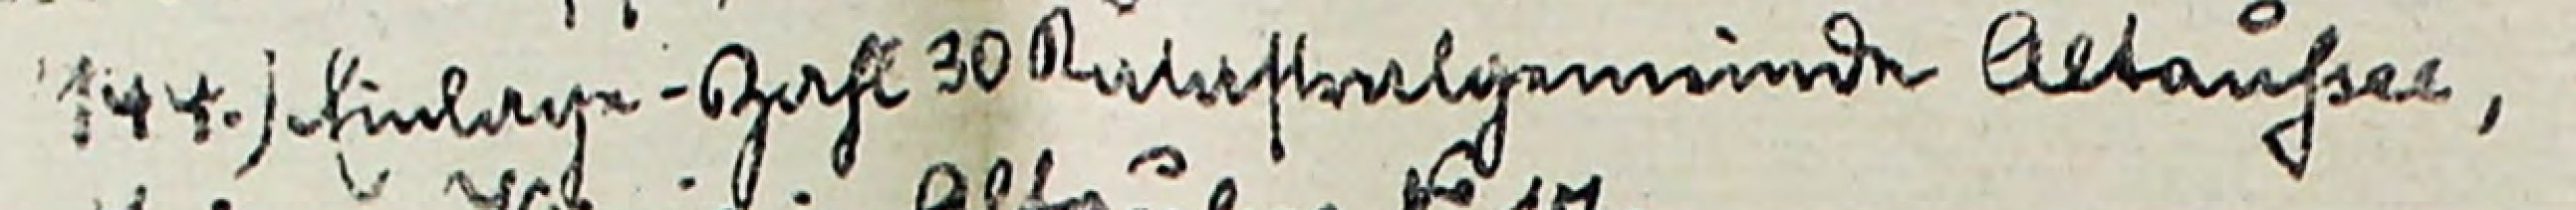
144.) Einlage - Zahl 30 Katastralgemeinde Altaussee,
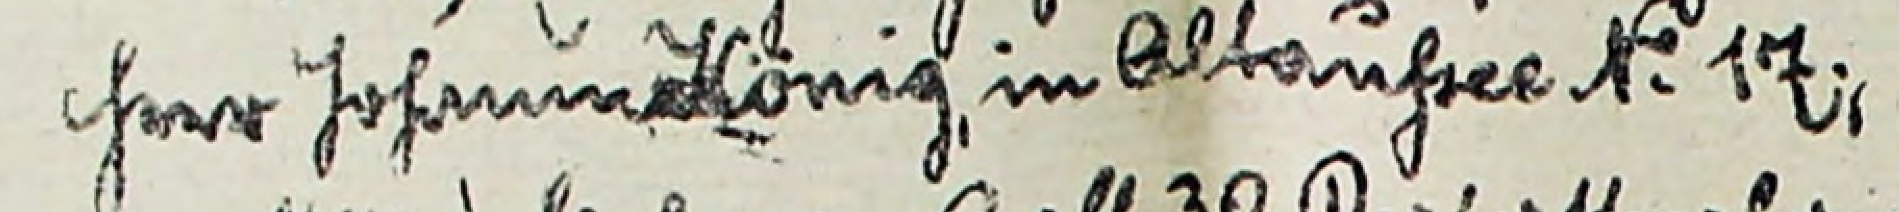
Herr Johann König, in Altaussee № 17;
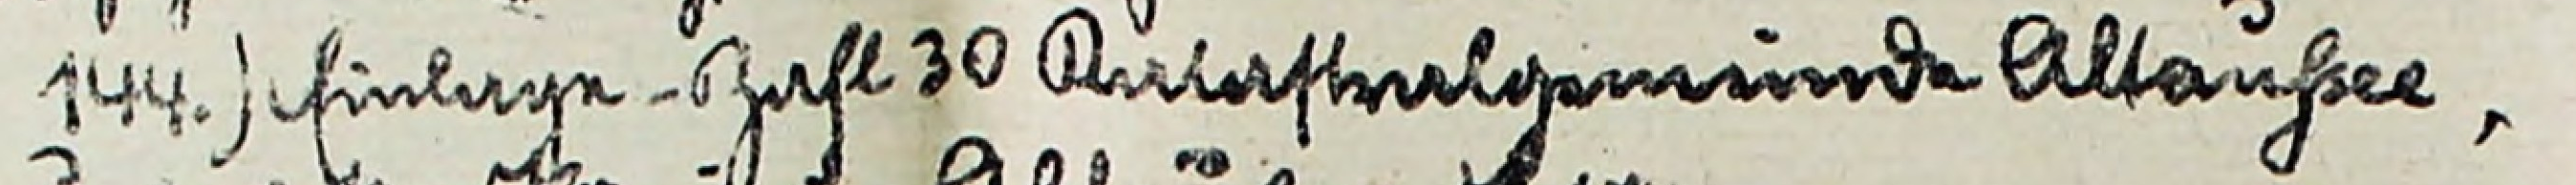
144.) Einlage - Zahl 30 Katastralgemeinde Altaussee,
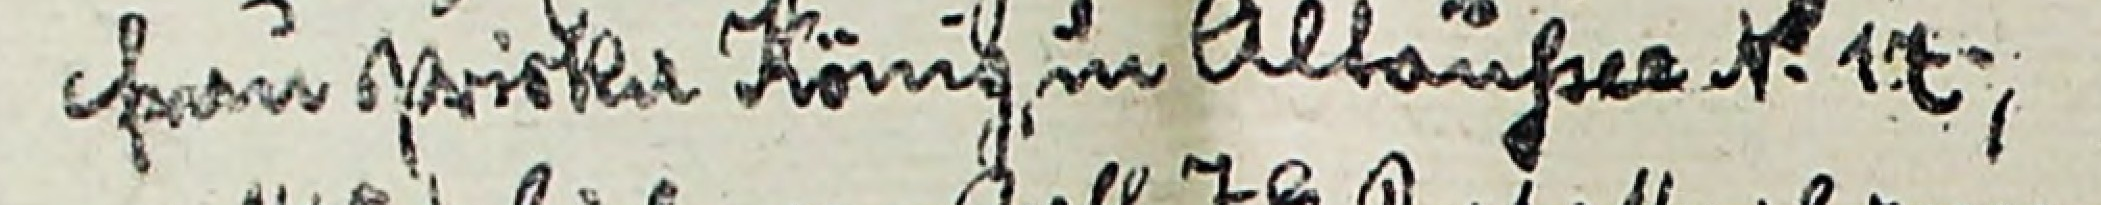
Frau Priska König, in Altaussee № 17;
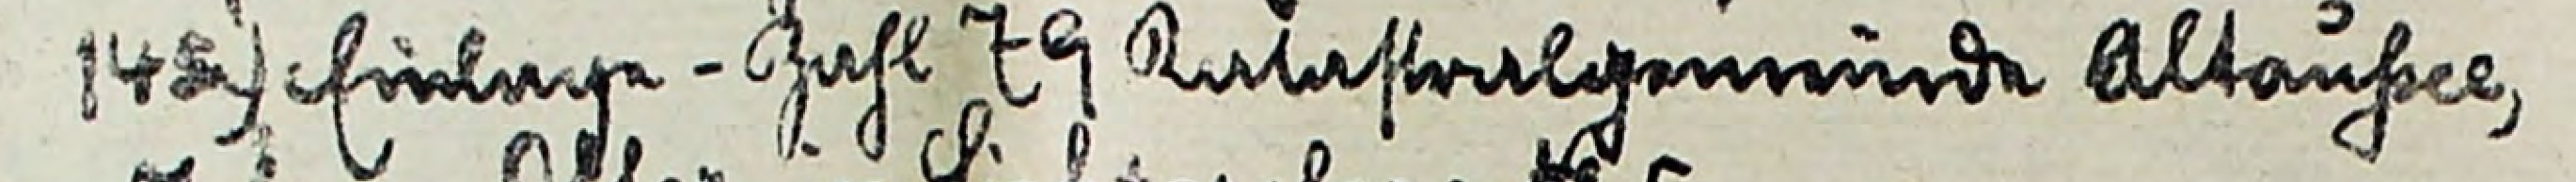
145.) Einlage - Zahl 79 Katastralgemeinde Altaussee,
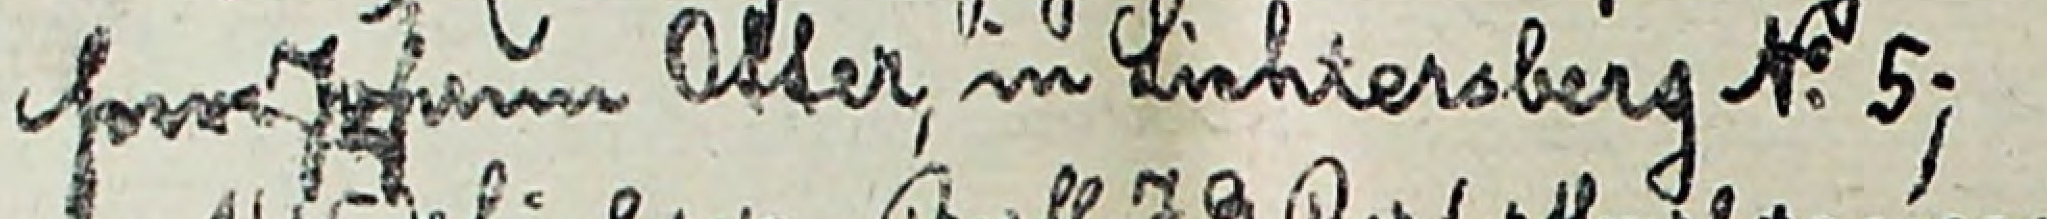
Herr Johann Otter, in Liehtersberg № 5;
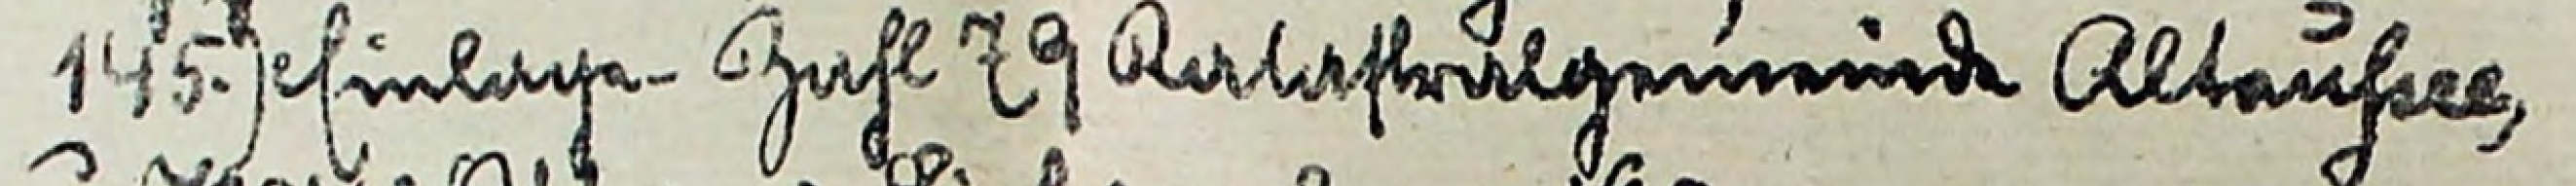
145.) Einlage - Zahl 79 Katastralgemeinde Altaussee,
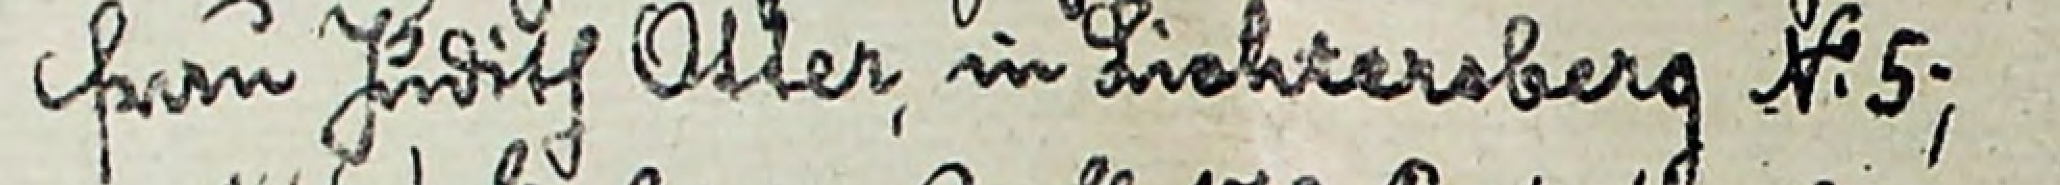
Frau Judith Otter, in Lichtersberg № 5;
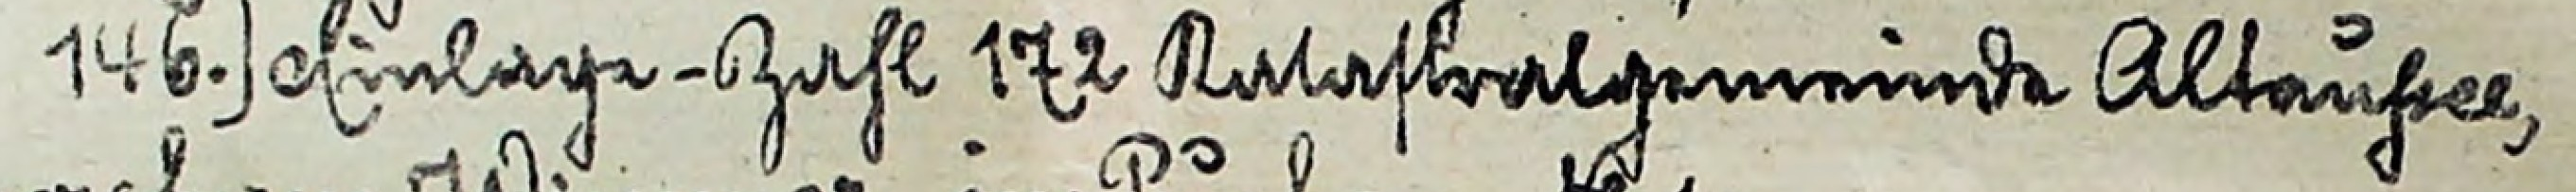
146.) Einlage - Zahl 172 Katastralgemeinde Altaussee,
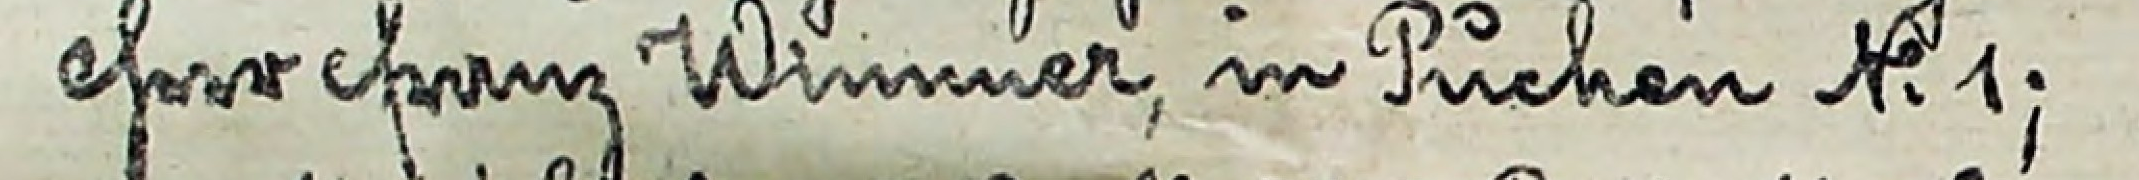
Herr Franz Wimmer, in Puchen № 1;
